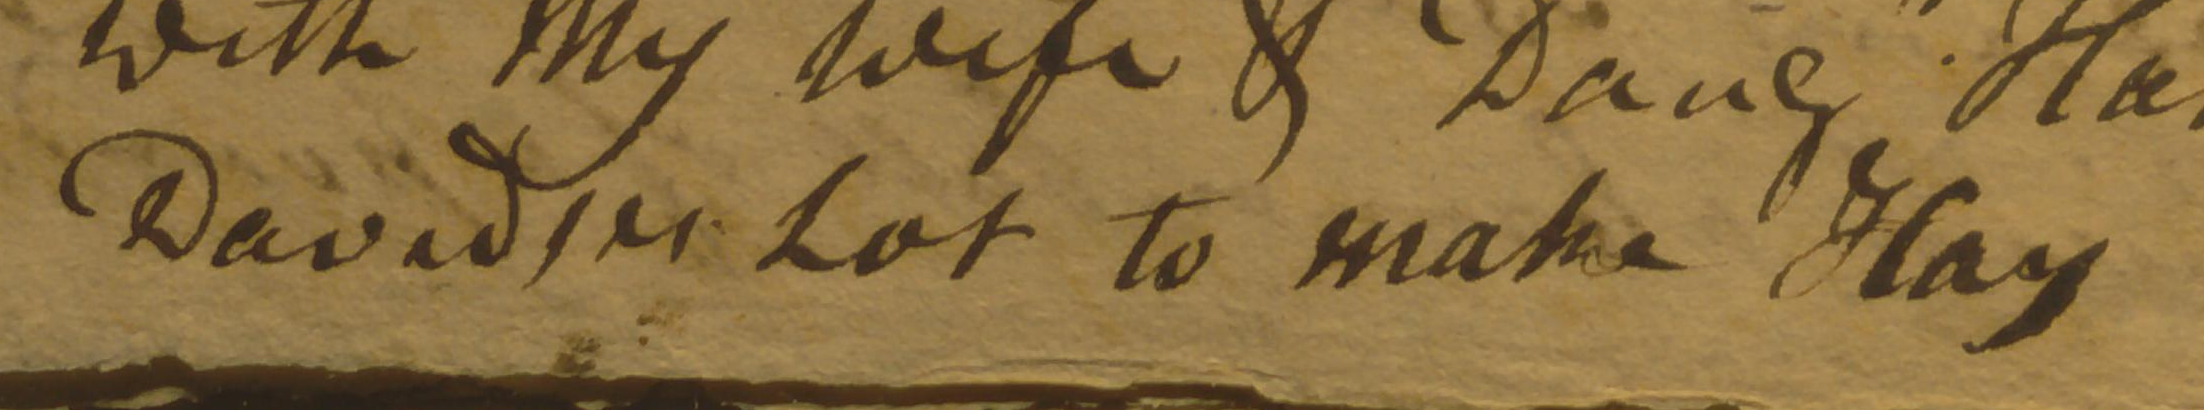Davidses Lot to make Hay
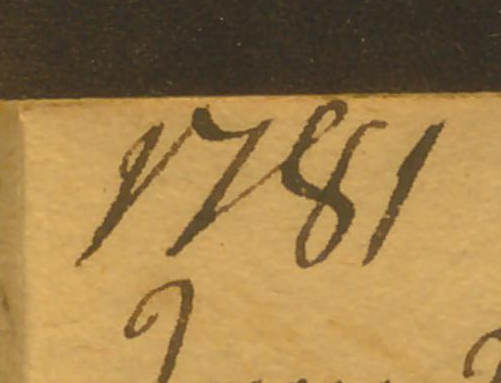1781
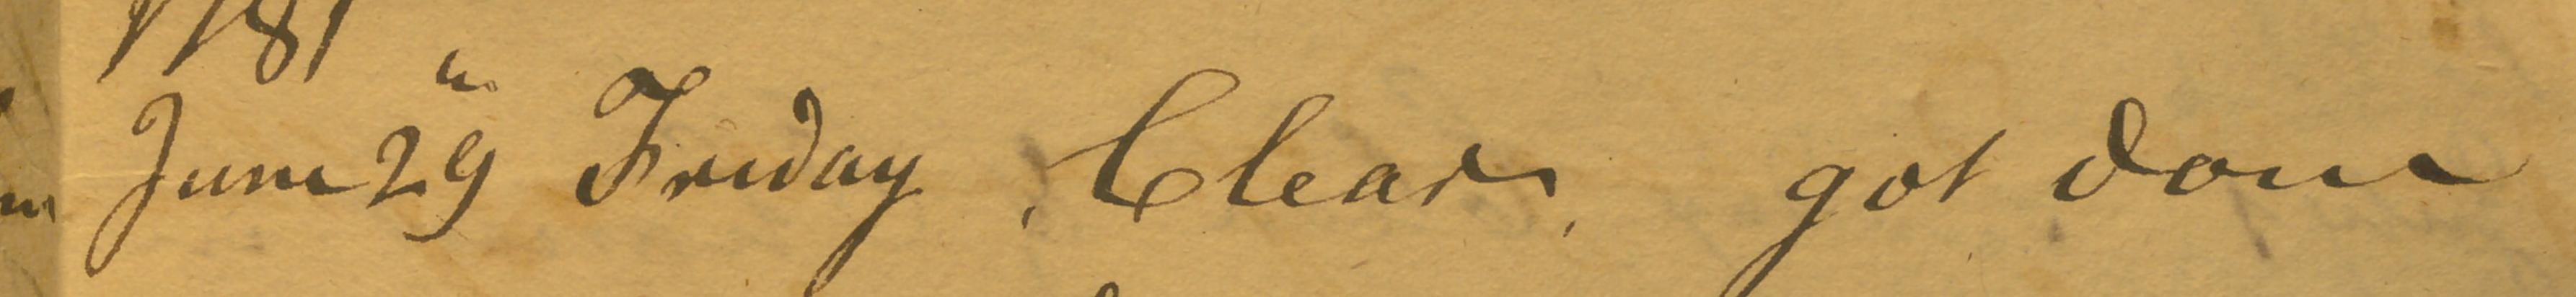June 29^th Friday Clear, got done
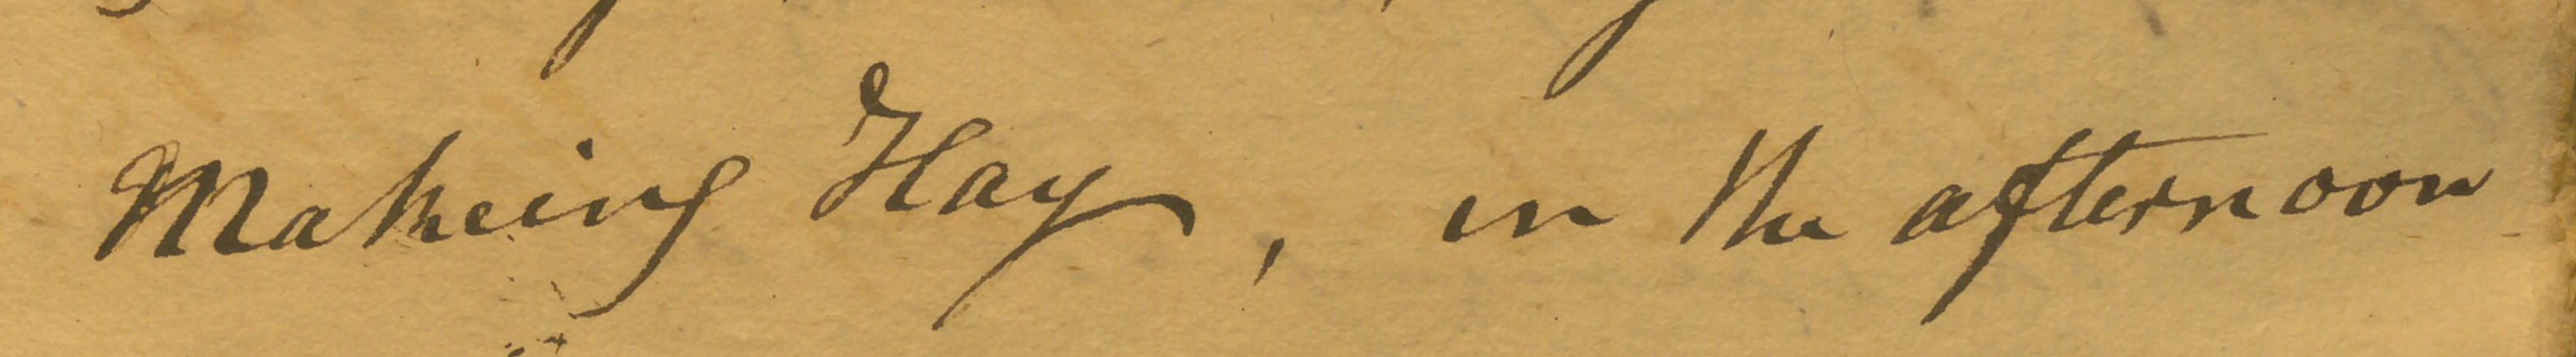Makeing Hay in the afternoon
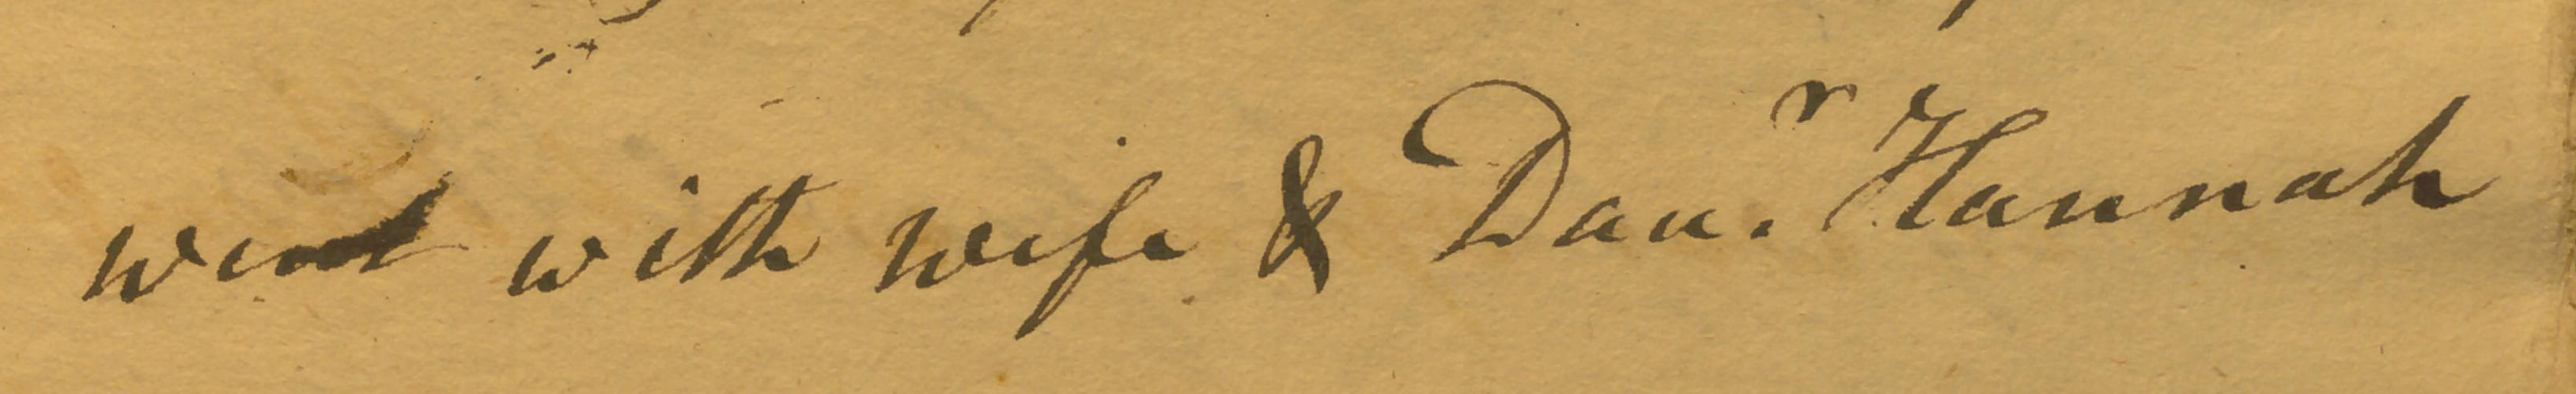went with wife & Dau^r. Hannah
